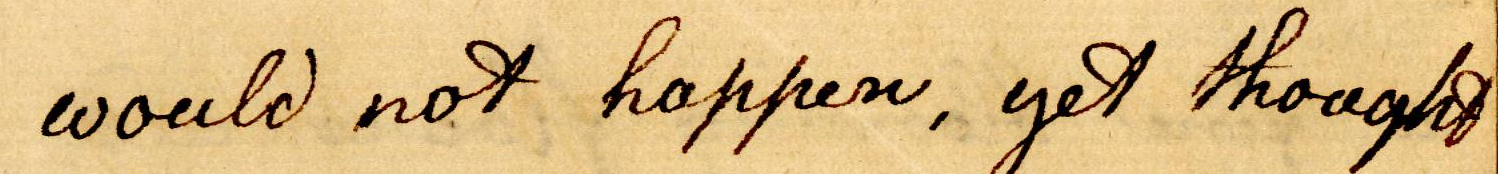would not happen, yet thought
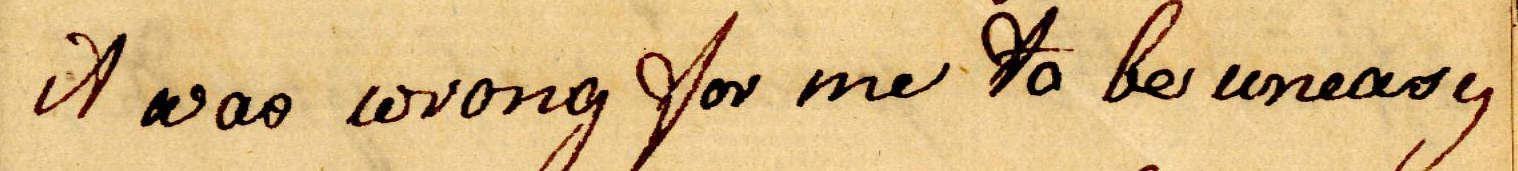it was wrong for me to be uneasy
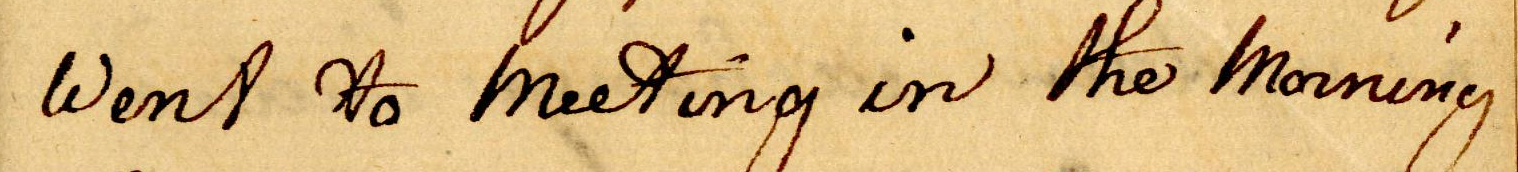Went to Meeting in the Morning
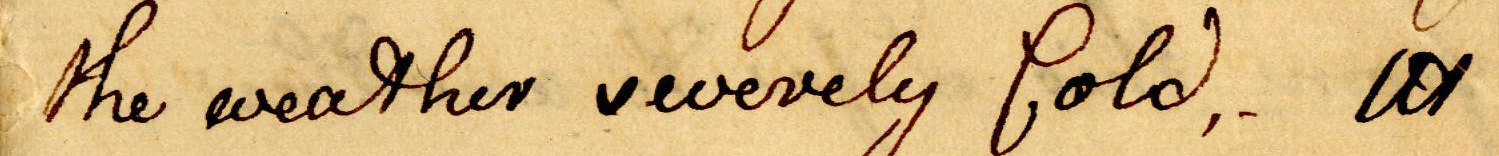the weather severely Cold,. At
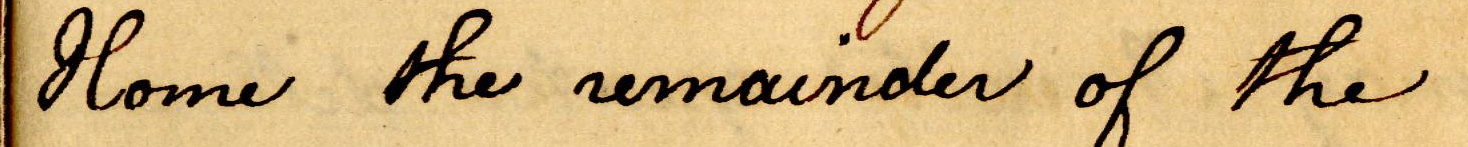Home the remainder of the
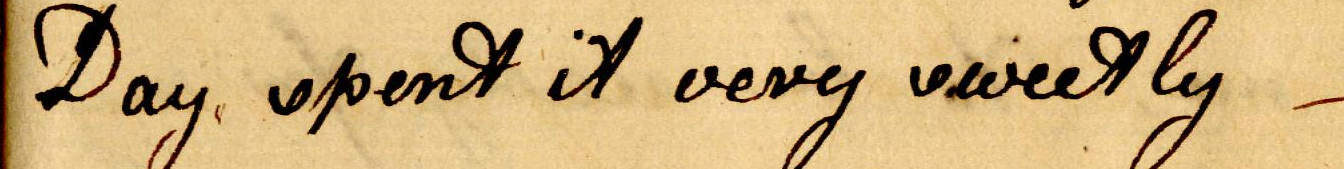Day. spent it very sweetly-
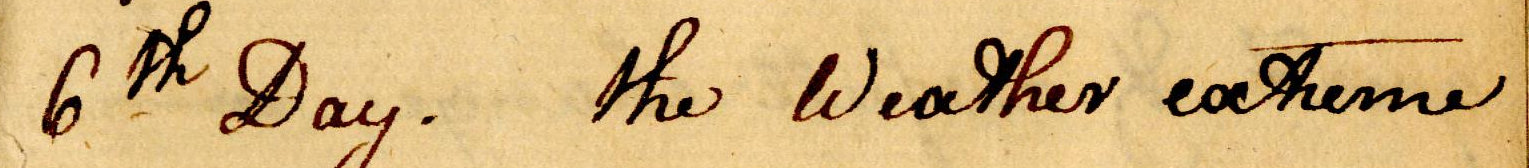6^th Day. the Weather extreme
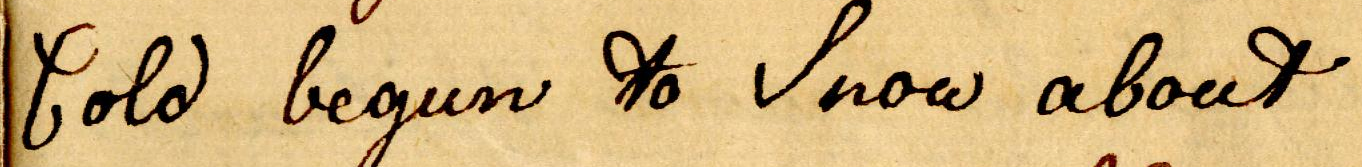Cold begun to Snow about
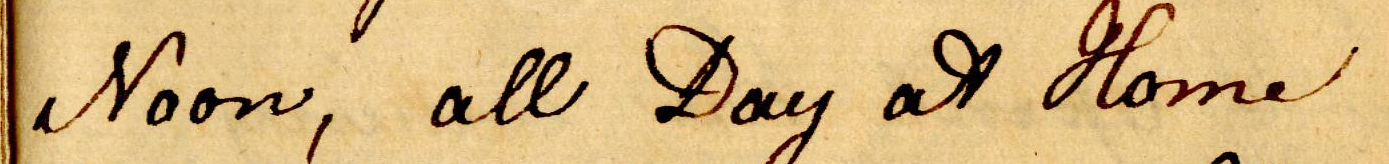Noon, all Day at Home
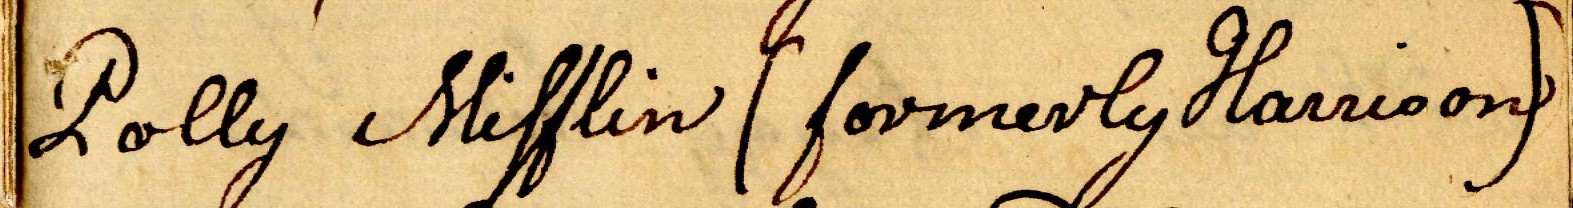Polly Mifflin (formerly Harrison)
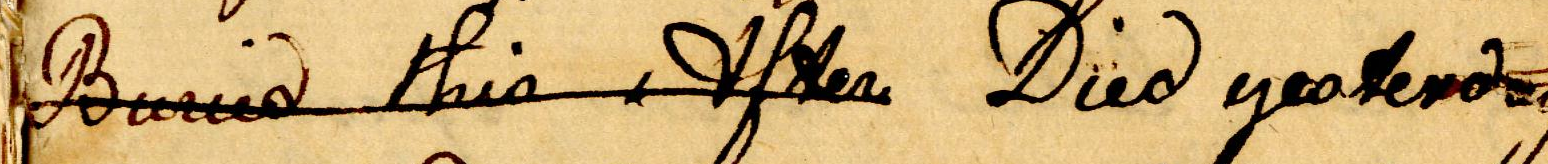[Buried this after] Died yesterday
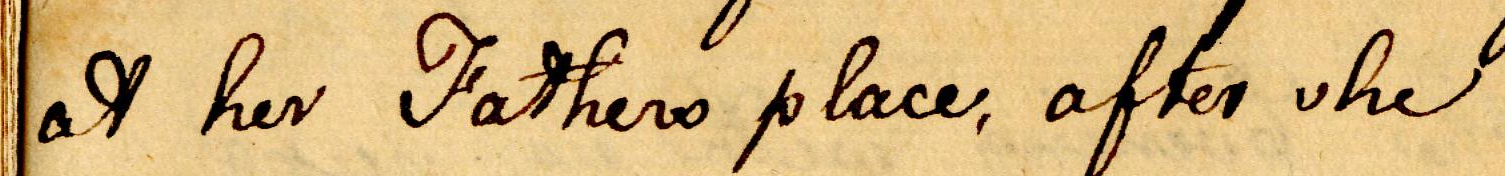at her Fathers place, after she
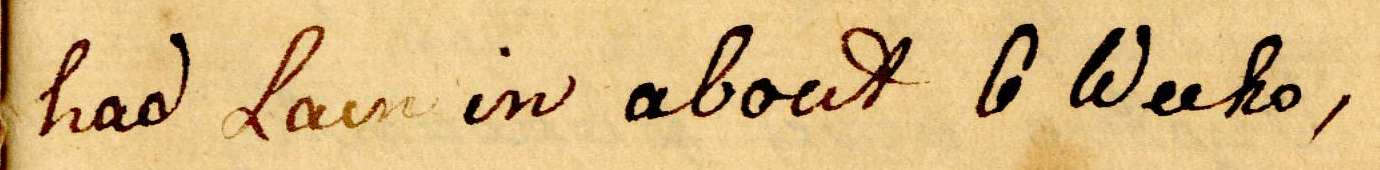had Lain about 5 Weeks,
